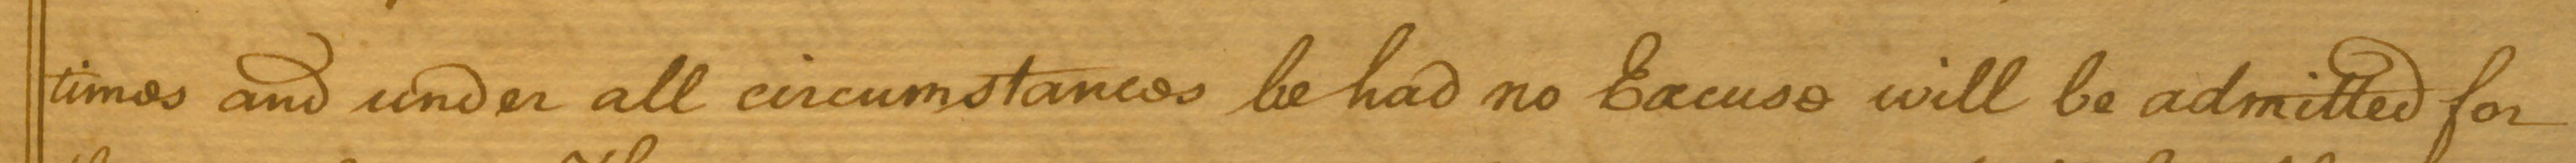times and under all circumstances be had no Excuse will be admitted for
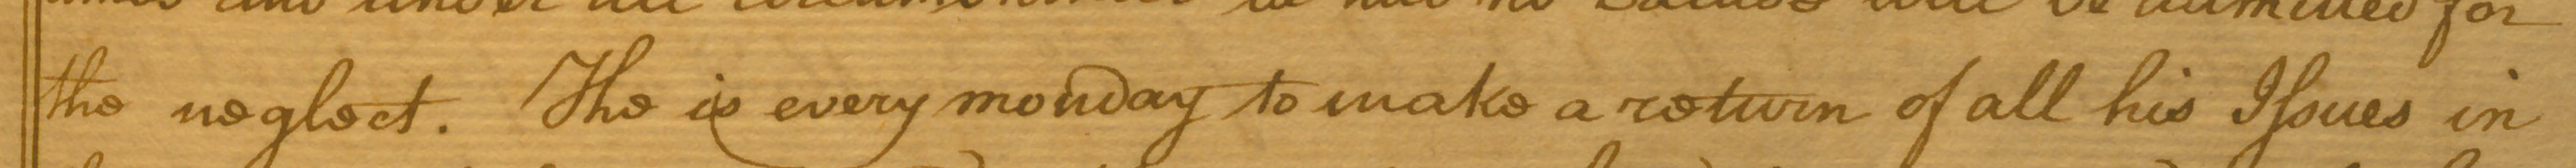the neglect. He is every monday to make a return of all his Issues in
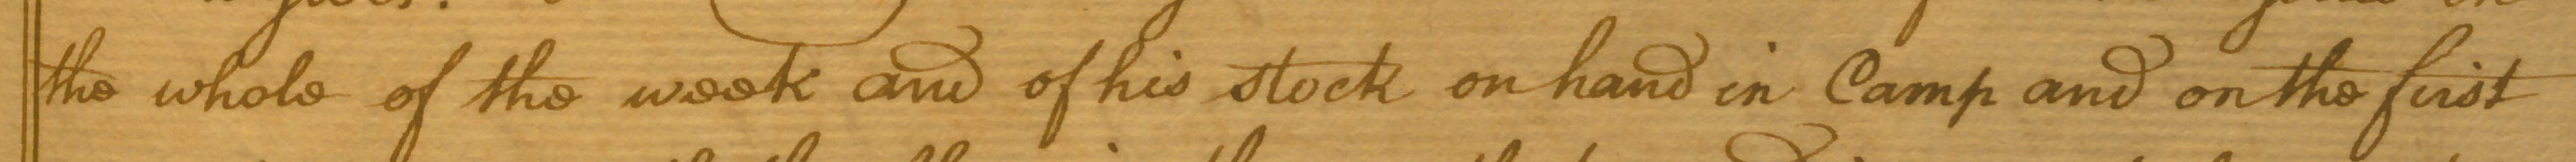the whole of the week and of his stock on hand in Camp and on the first
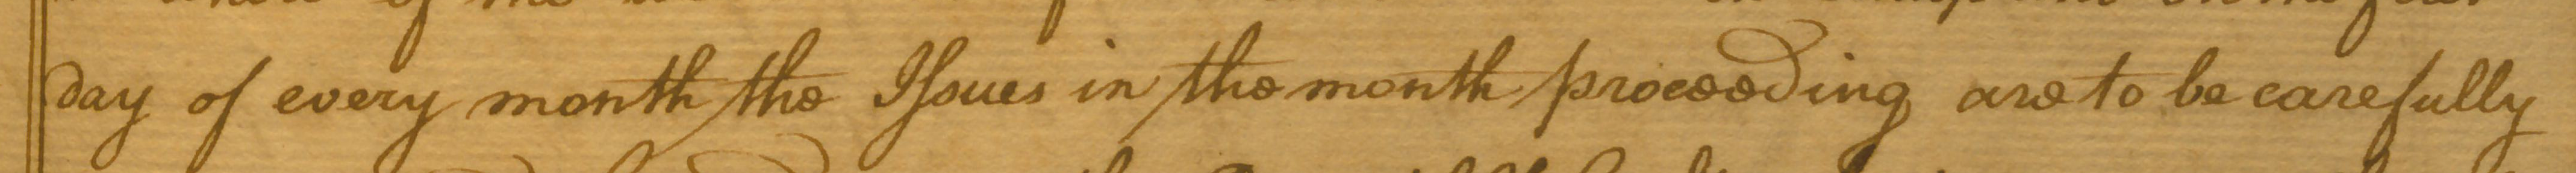day of every month the Issues in the month proceeding are to be carefully
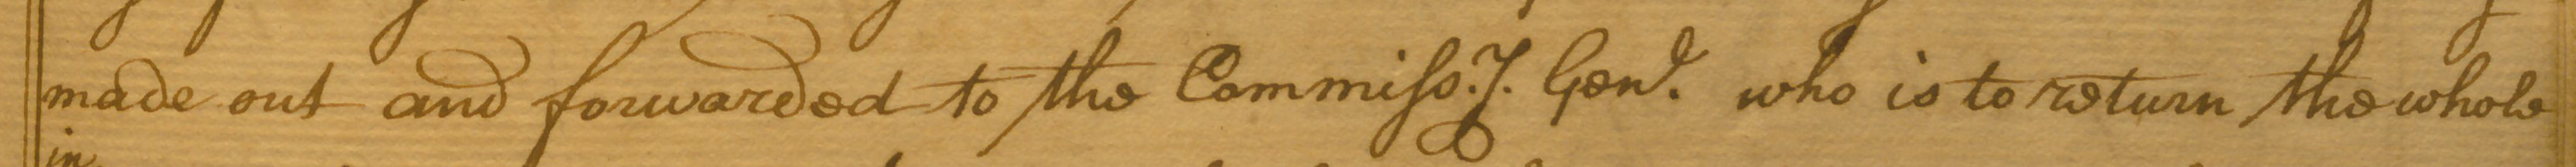made out and forwarded to the Commiss^y. Gen^l. who is to return the whole
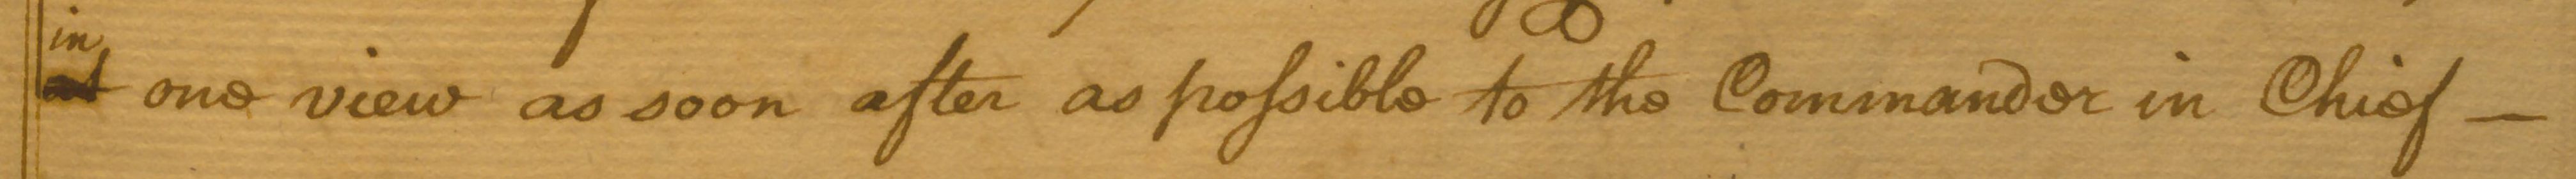[at] ^in one view as soon after as possible to the Commander in Chief-
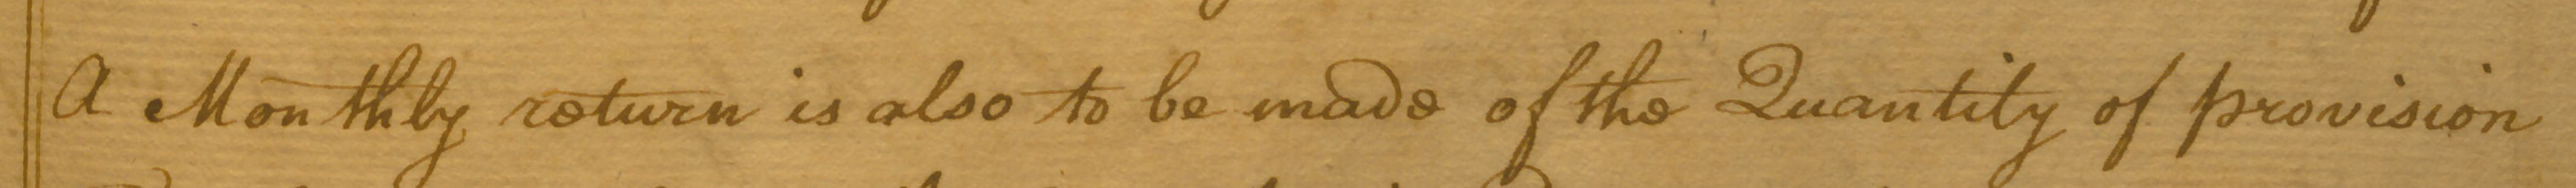A Monthly return is also to be made of the Quantity of provision
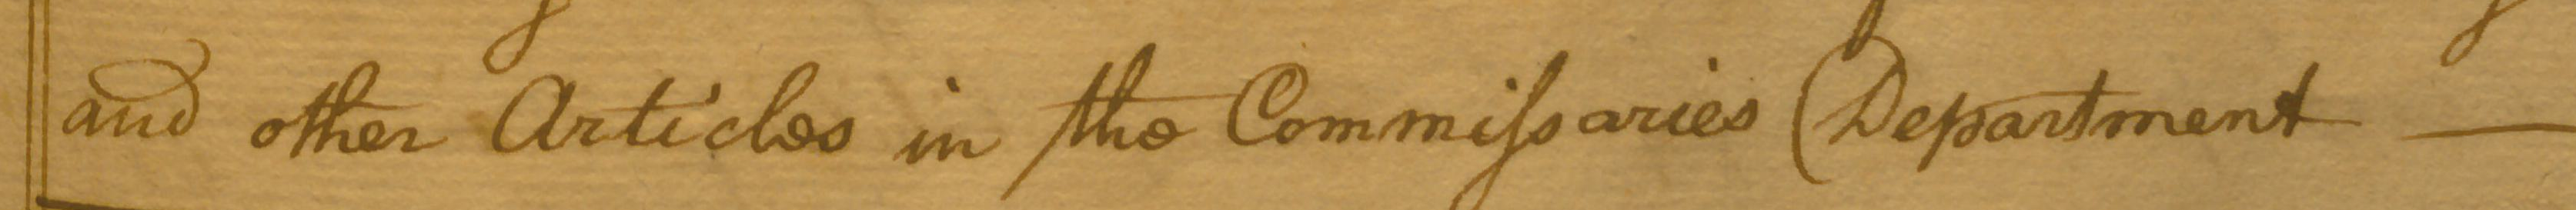and other Articles in the Commissaries Department-
